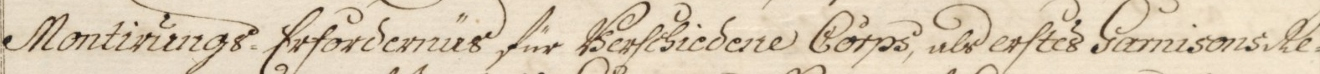Montirungs- Erfordernüs für Verschiedene Corps, als erstes Garnisons Re-
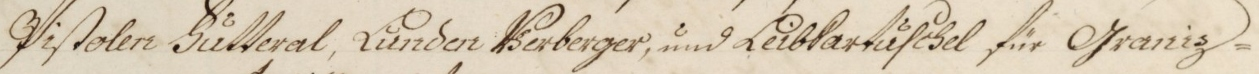Pistolen Futteral, Lunden Verberger, und Leibkartuschel für Graniz-
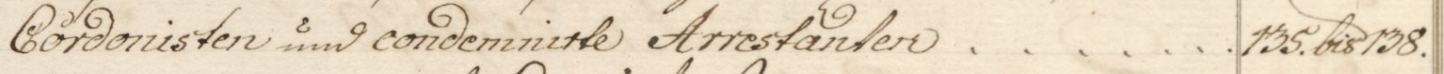Cordonisten und condemnirte Arrestanten. 135. bis 138.
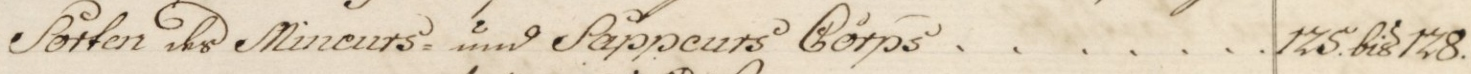Sorten des Mineurs- und Sappeurs Corps. 125. bis 128.
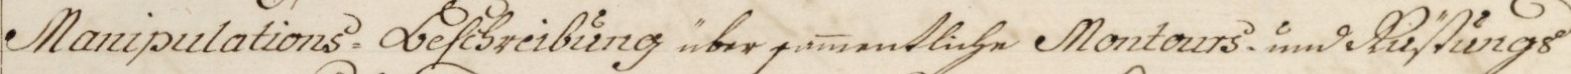Manipulations- Beschreibung über sammentliche Montours- und Rüstungs
